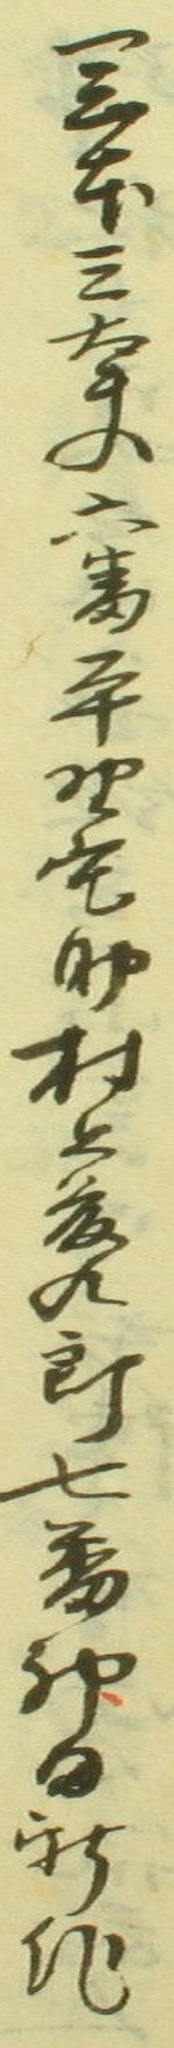岡本三太夫六番平野宅助村上藤九郎七番神田新作
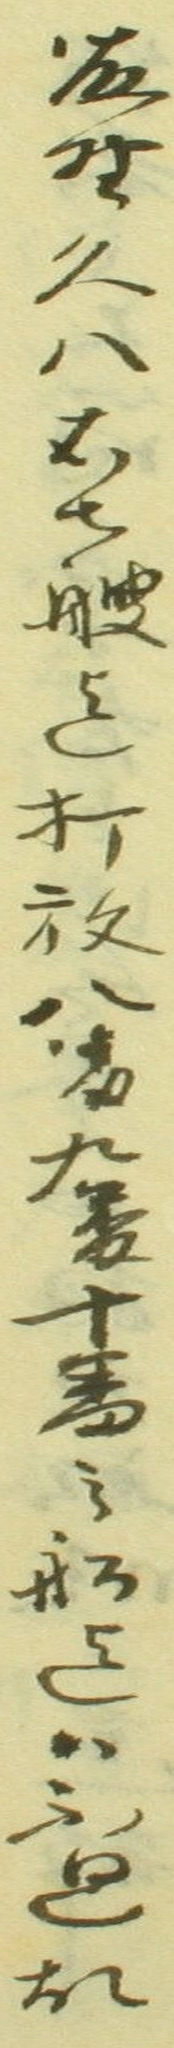藤野久八右七艘迄打放八番九番十番之船迄は不廻故
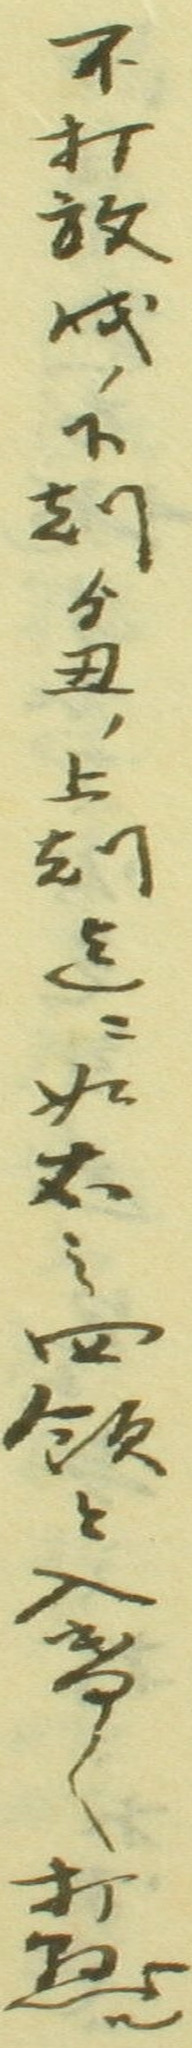不打放戌ノ下刻ゟ丑ノ上刻迄ニ如右之四領と入替〳〵打懸ル
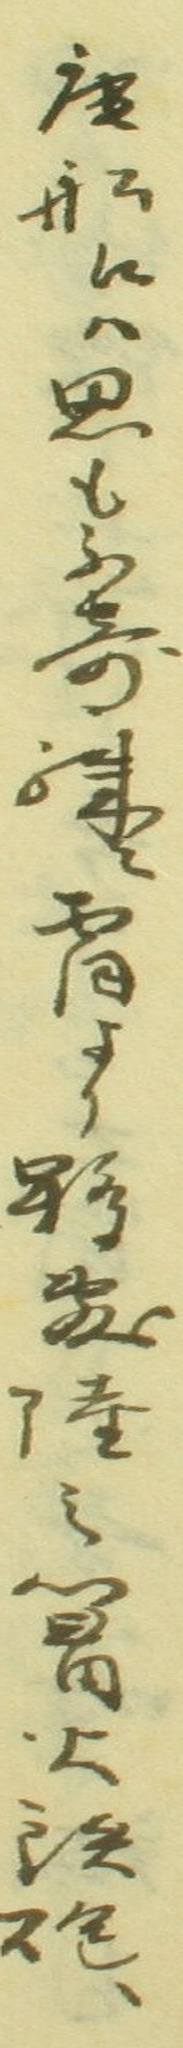唐船には思も不寄誠に宵より夥敷陸之篝火鉄砲へ
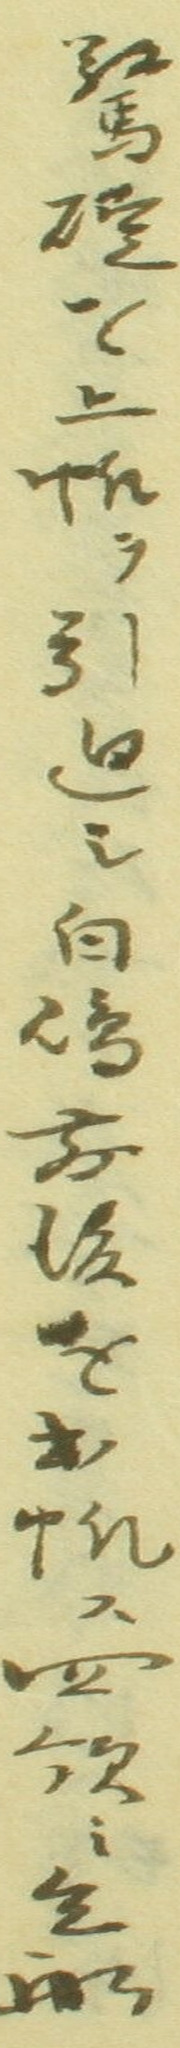騖碇と上帆ヲ引廻し白島前後を出帆ス四領之全船
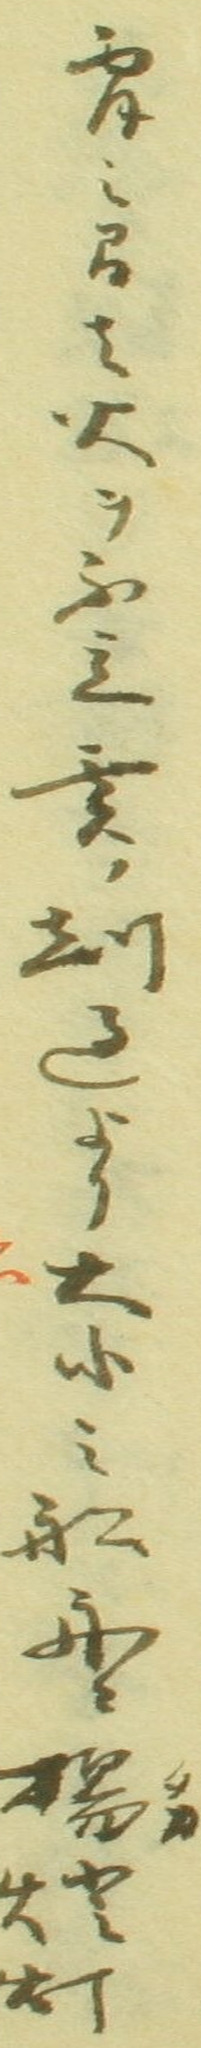宵之間は火を不立亥ノ刻過より大小之船舟に揚燈灯
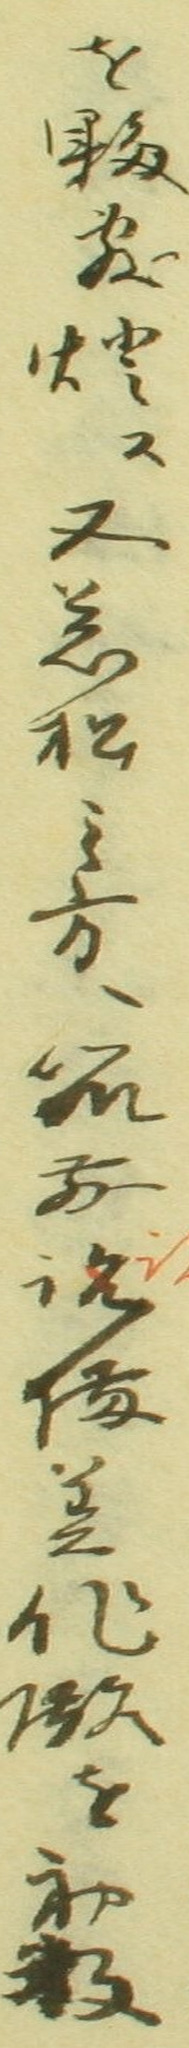を夥敷燈ス又若松之方へ最前諸備美作殿を初数
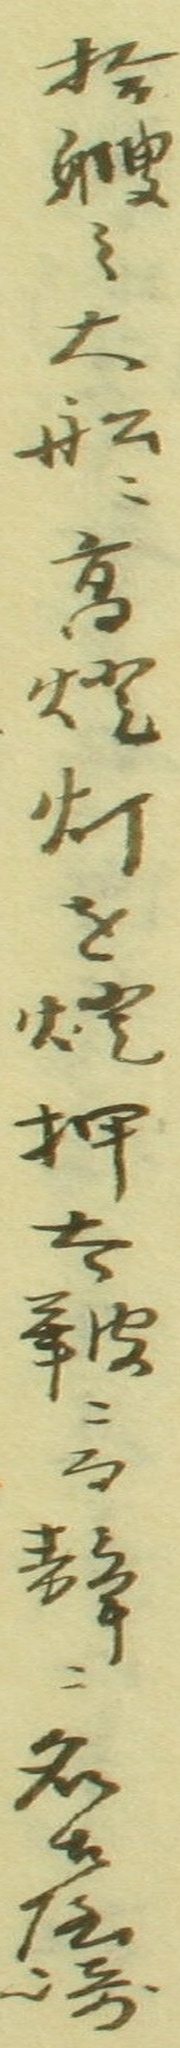拾艘之大船に高燈灯を燈押太鼓ニ而静ニ名古屋崎
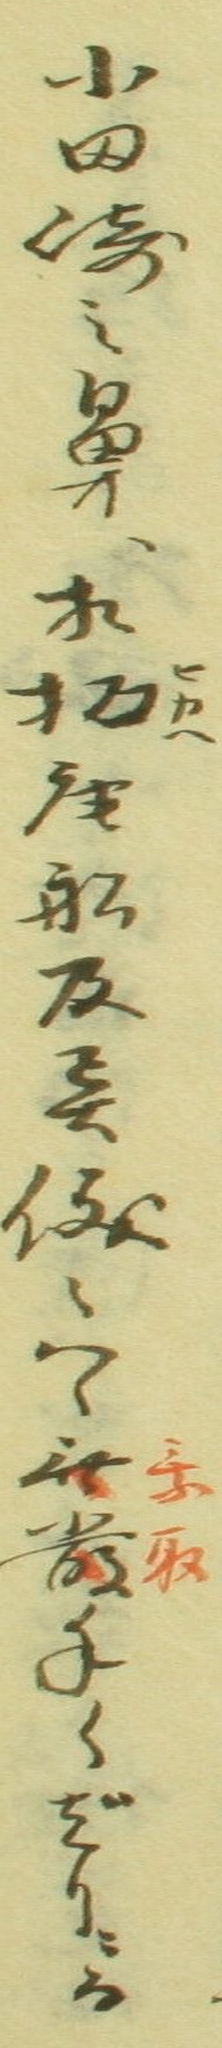小田崎之鼻へ相扣唐船及異儀候はゝ乗取手くばりに而
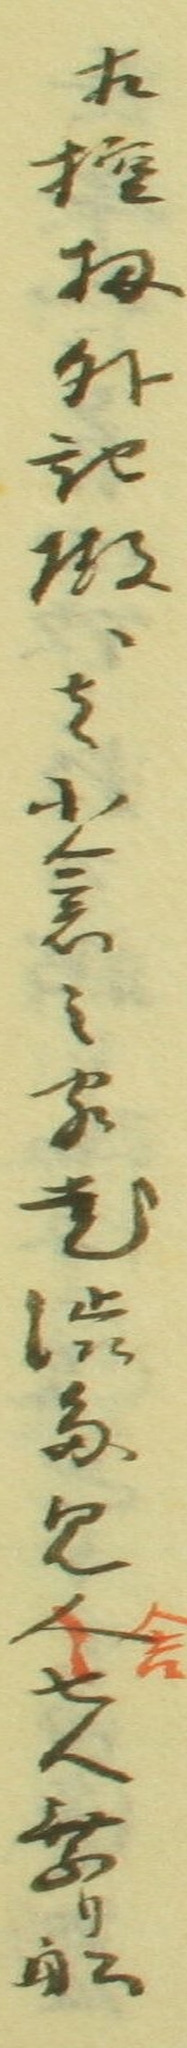相擦扨外記殿へは小倉之家老渋多見合七人乗り船

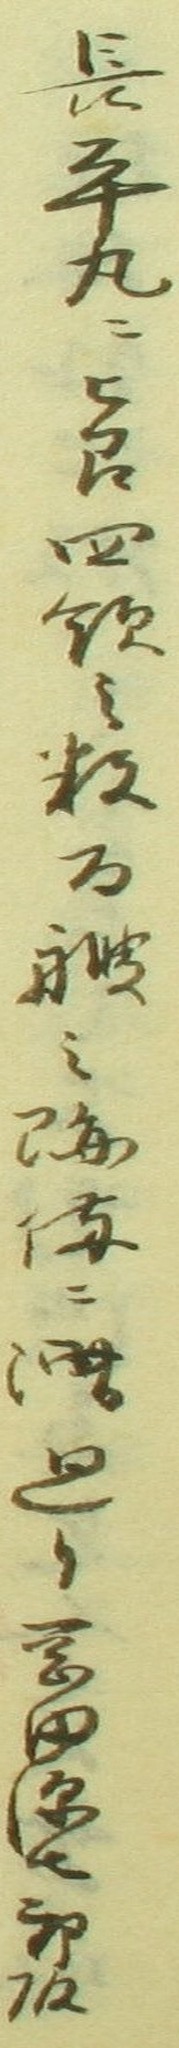長平丸に被召四領之数百艘之跡備に漕廻り岡田源七郎殿
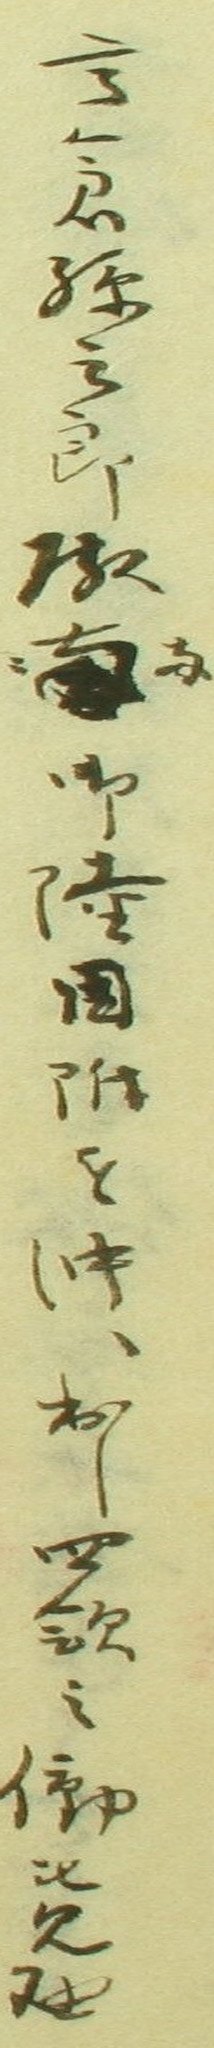高倉弥三郎殿両御陸目附を沖へ出し四領之働被見届
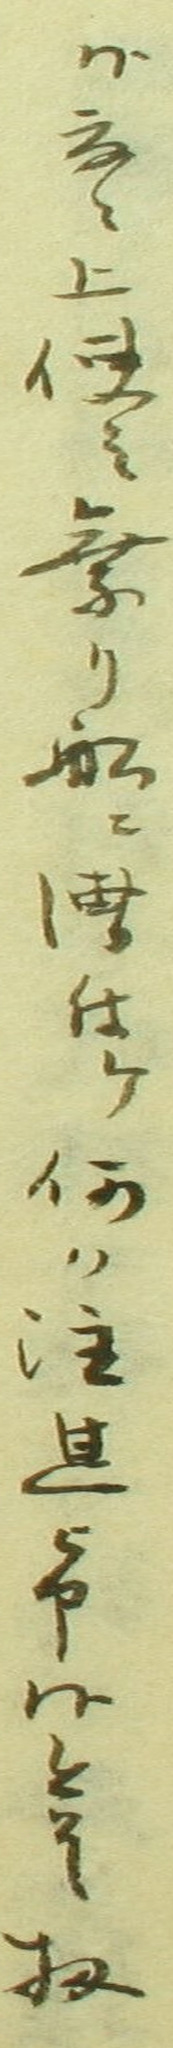候度々上使之乗り船に漕付ケ何か注進被申候とそ扨
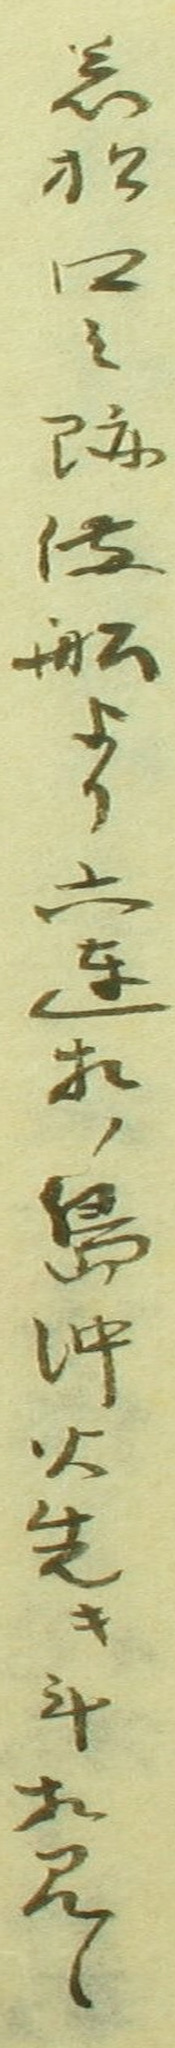若松口之跡備船より六連相ノ島沖火先キ斗相見し
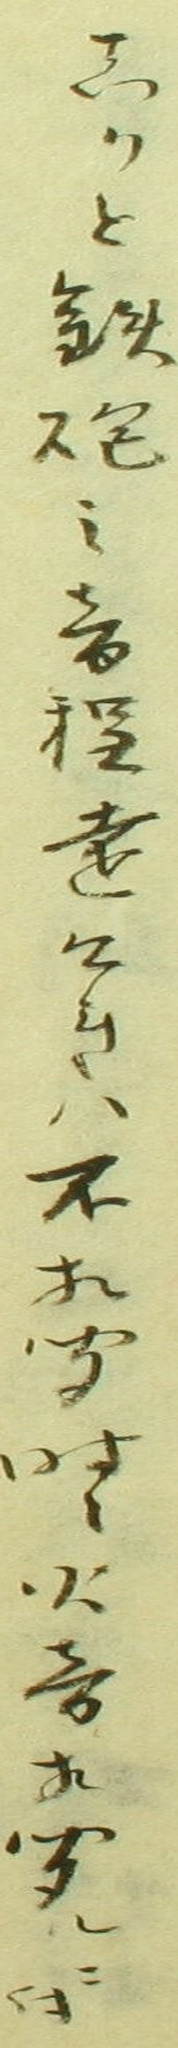しかと鉄砲之音程遠けれは不相聞時々火音相聞候に付
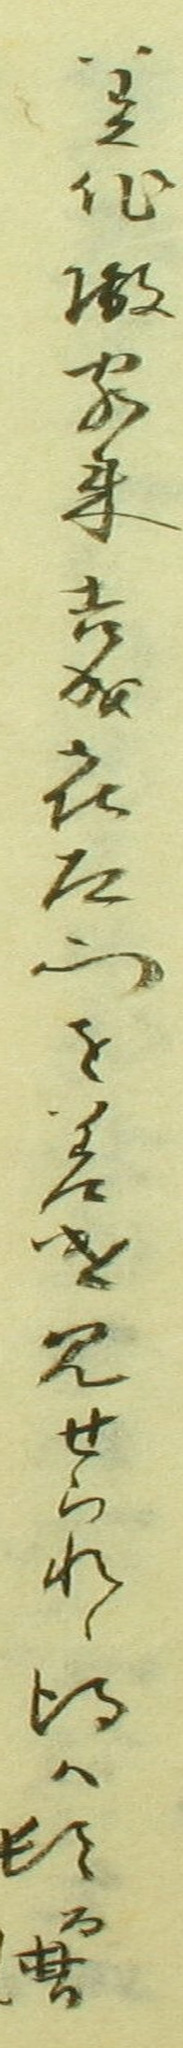美作殿家来吉成喜左衛門を差遣見せられ候得は頓而漕
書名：唐船漂流記 二
